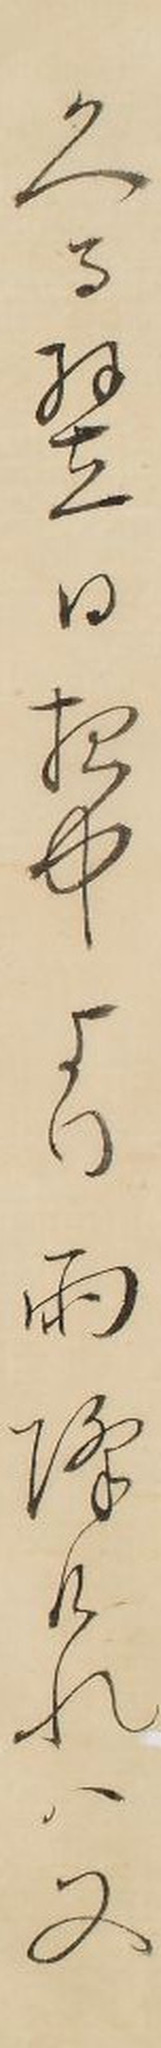かへる翌日夜中より雨降けれは又
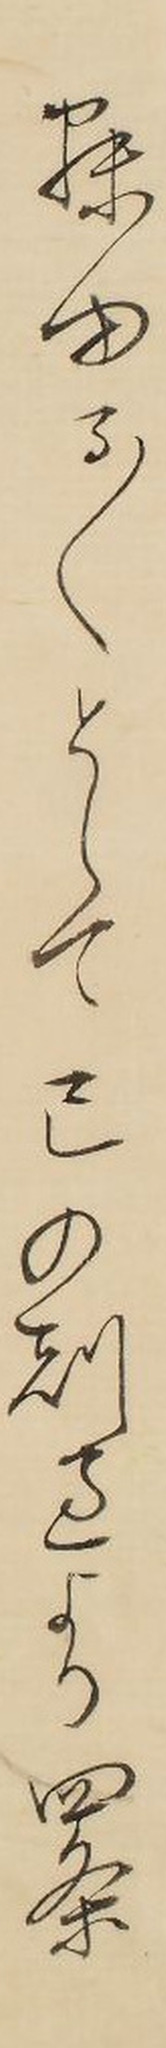寝ゆる〳〵として巳の刻過より四条
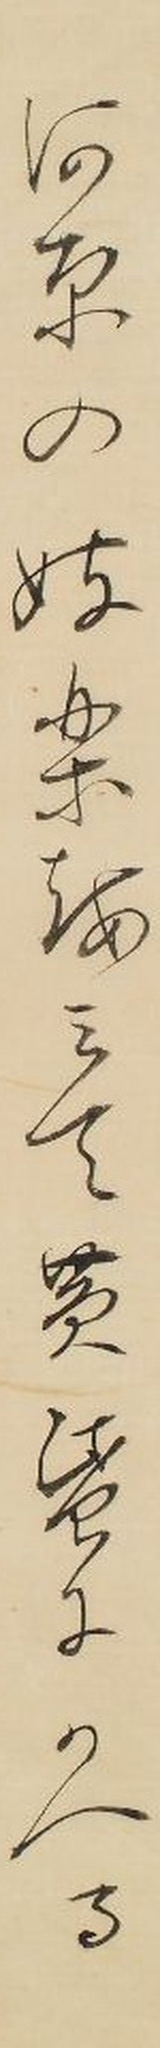河原の妓楽をみて黄昏にかへる
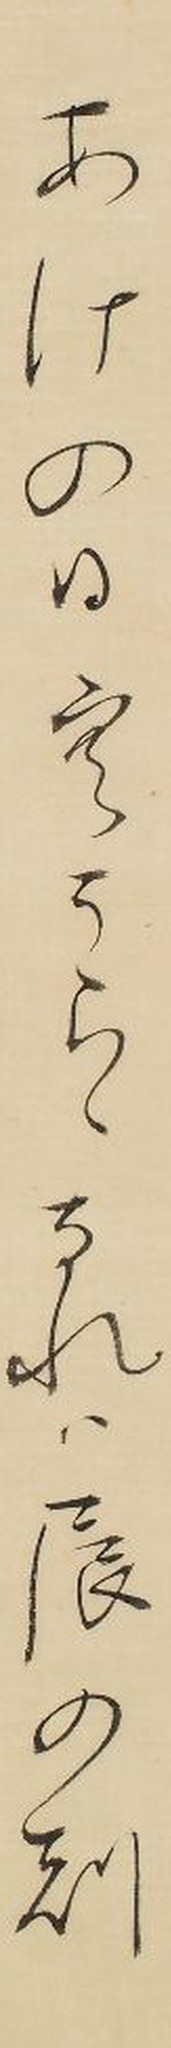あけの日空うらゝなれは辰の刻
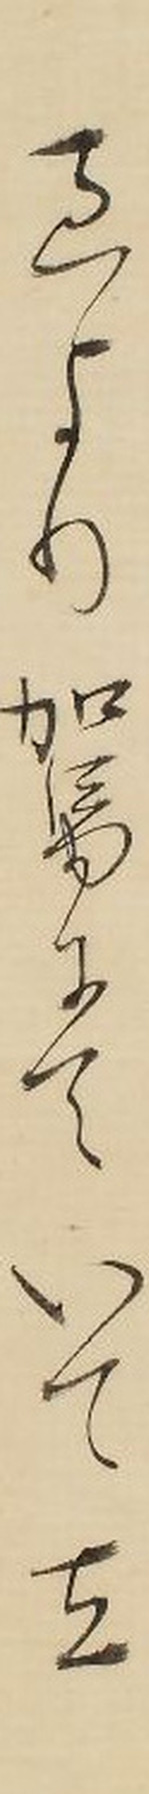過より駕にていて立
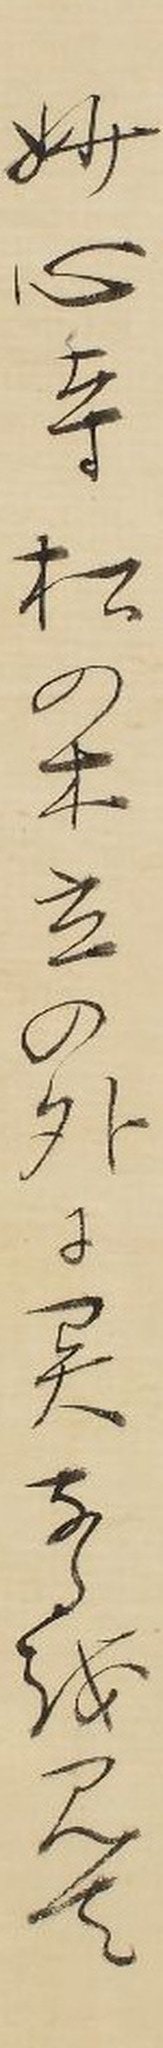妙心寺松の木立の外に異なるを見て
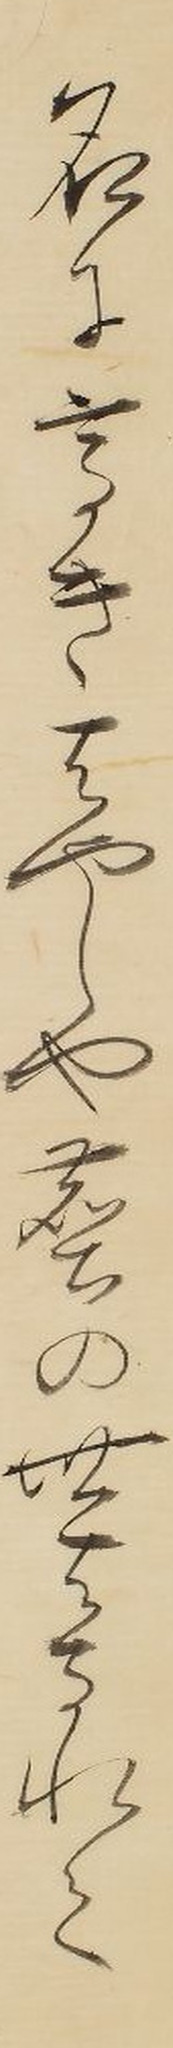名に高きはやしや塵の世はなれて
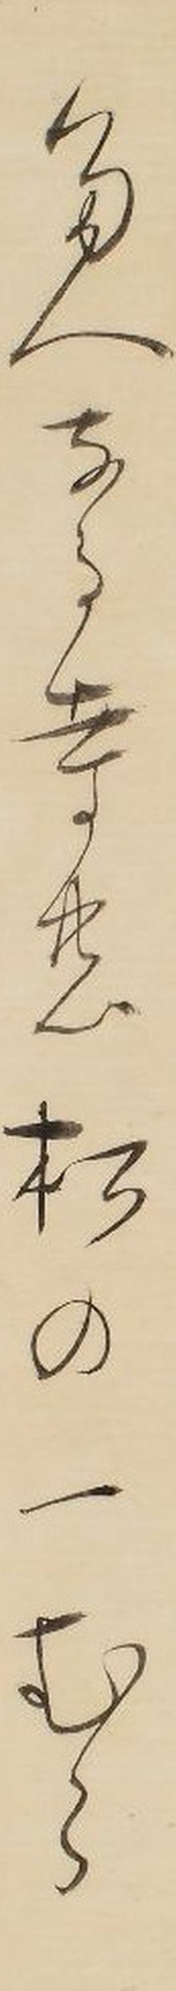たへなる寺の松の一むら
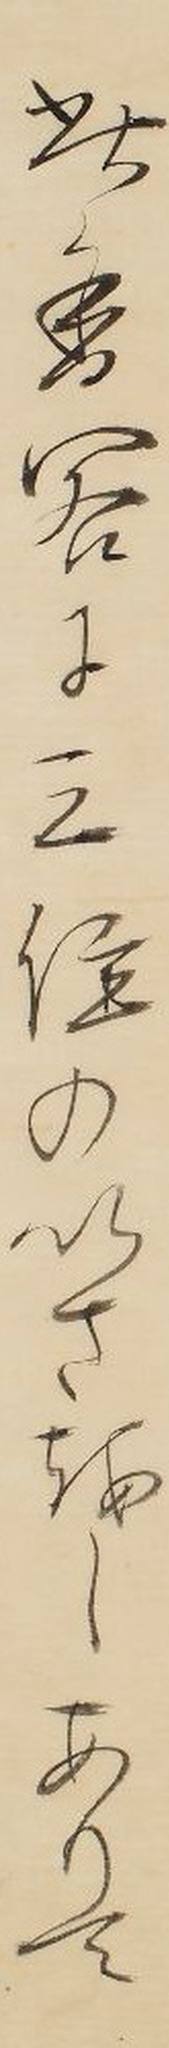此香閣に三住のいさをしありて
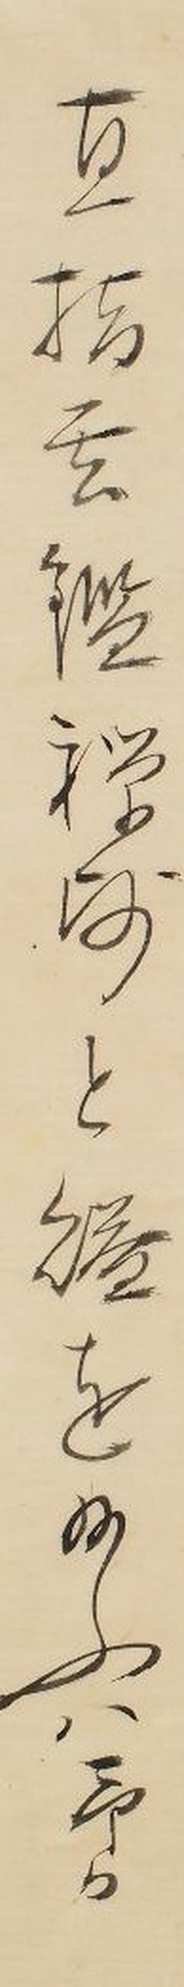直指玄鑑禅師と諡を給ふは予か
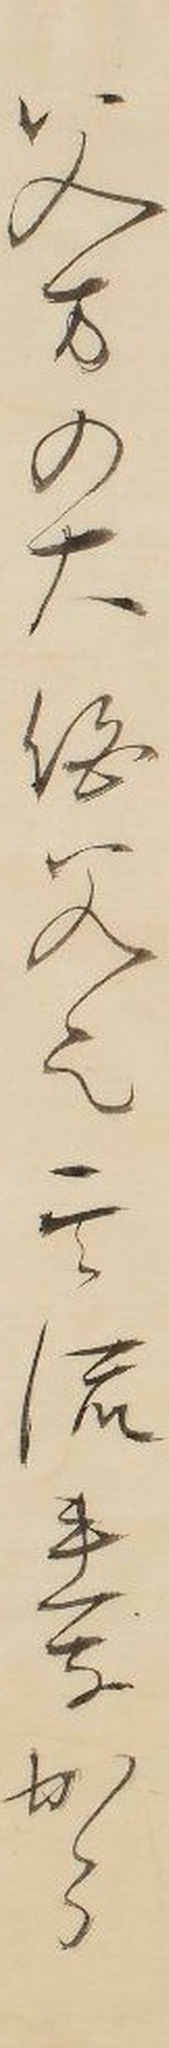父方の大伯父也其流れなから
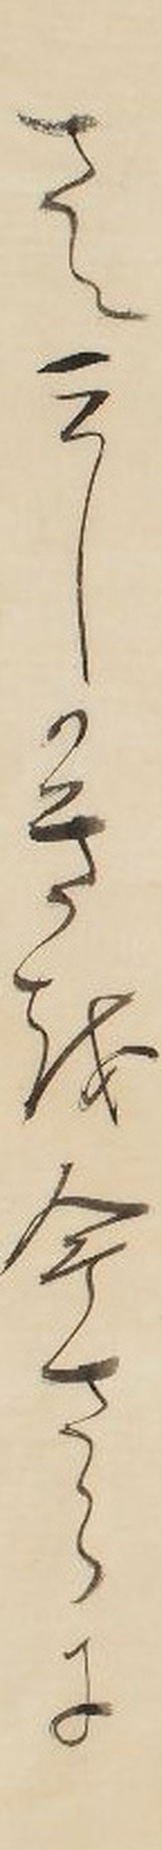さえみしかきを今さらに
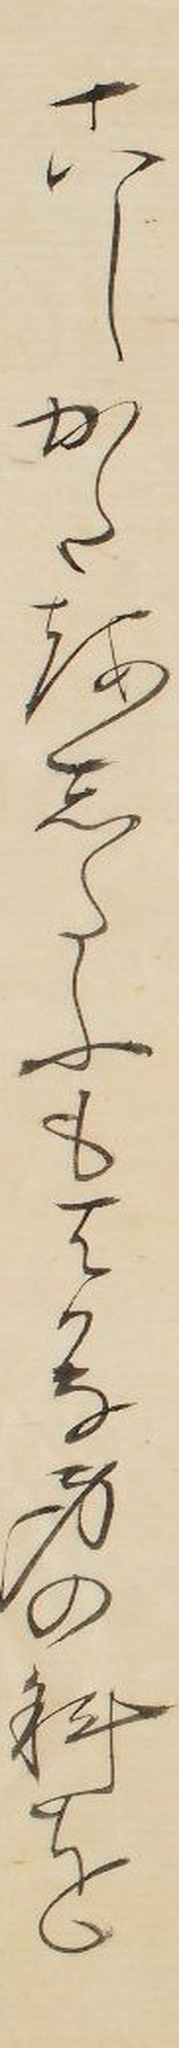こしかたをしるにもはかな身の科を
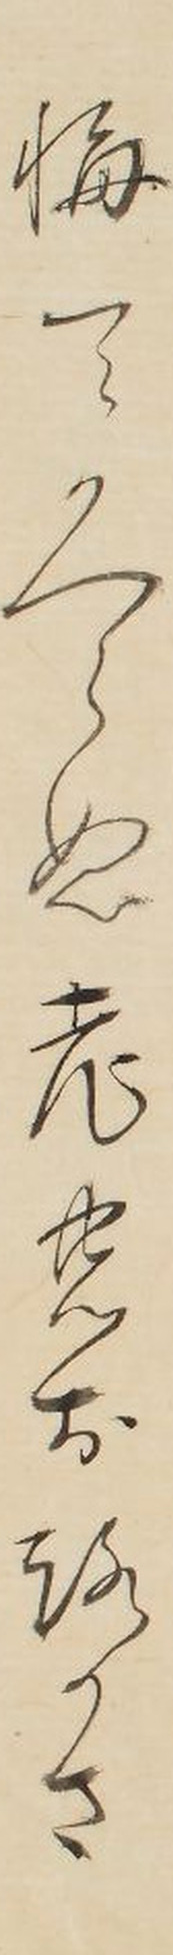悔てかへらぬ老のおろかさ
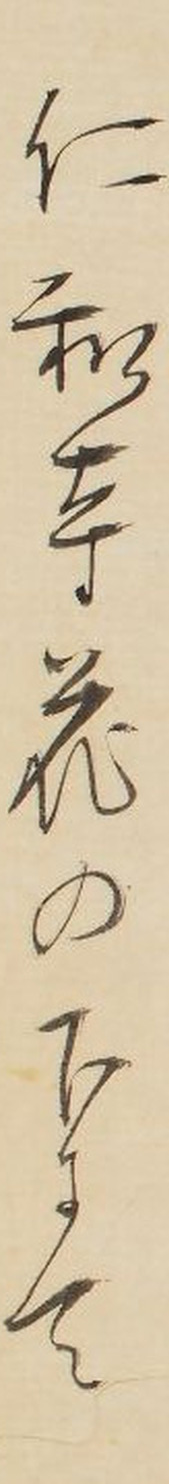仁和寺花の下にて

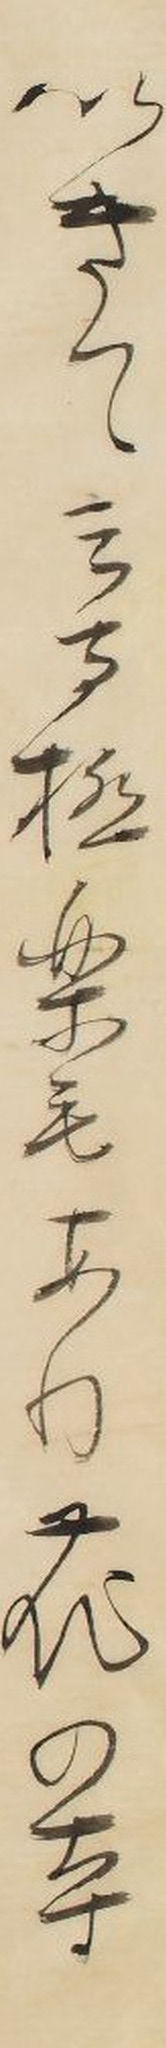いきてみる極楽もあり花の寺
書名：花土産
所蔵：徳島県立図書館
